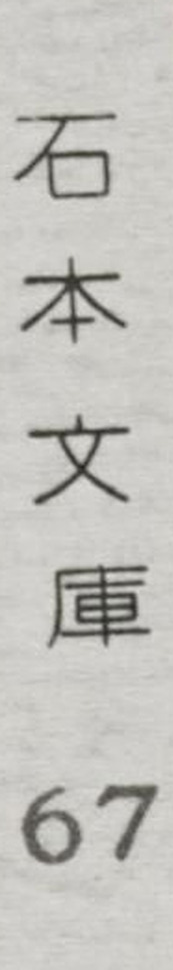石本文庫

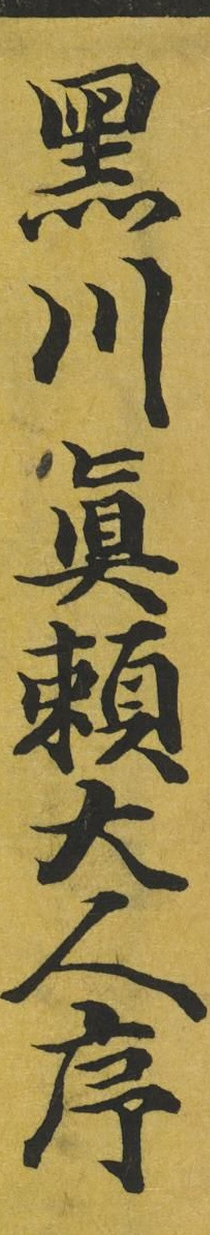黒川真頼大人序
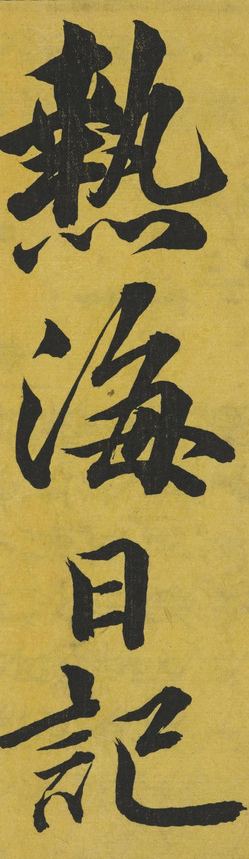熱海日記
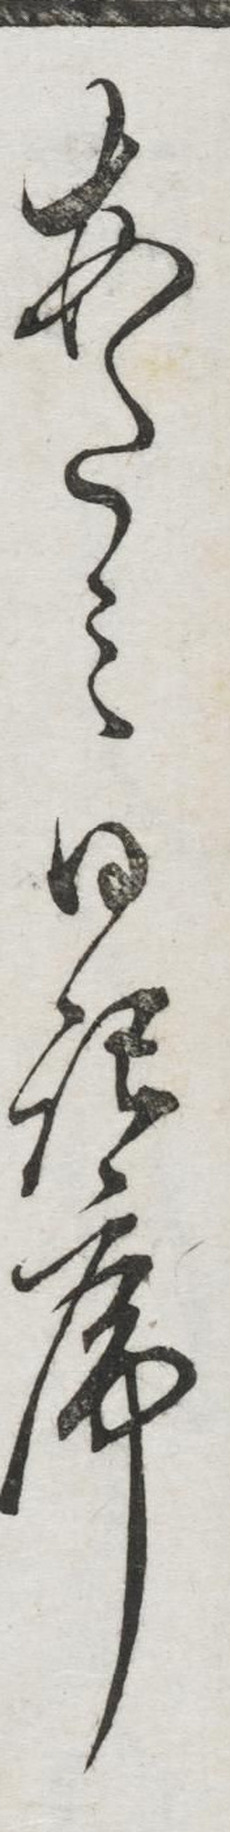あたみ日記序
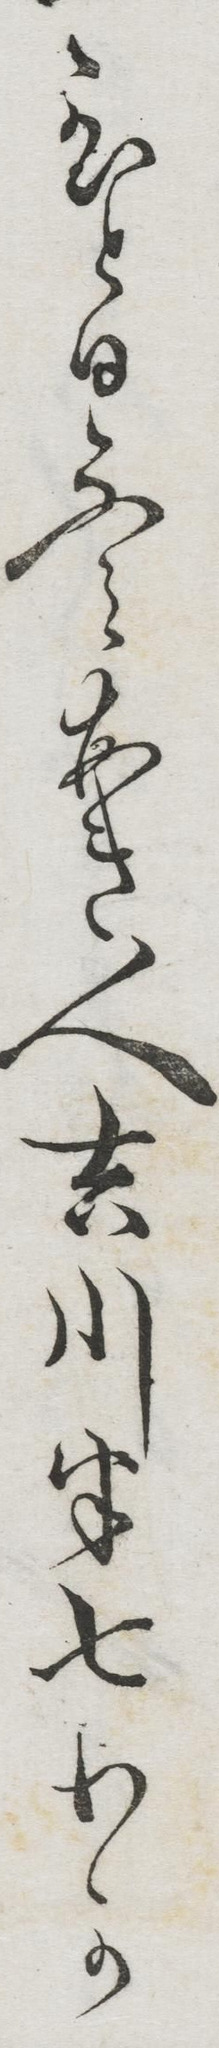ひと日ふみあき人吉川半七わか
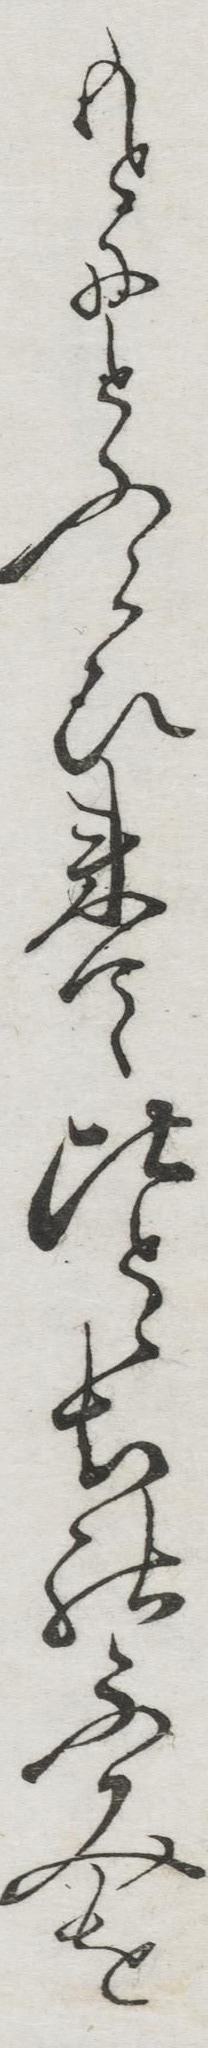もとにとふらひ来てひとゝちのふみを
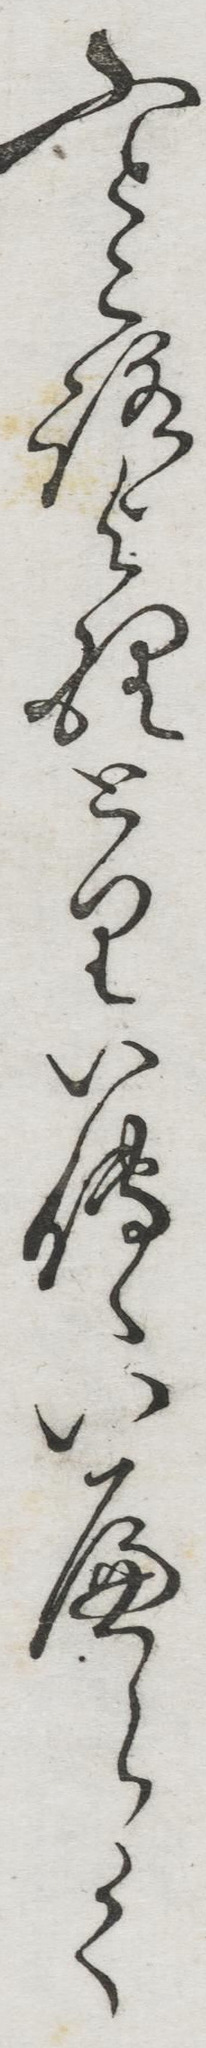ふところよりとりいてゝいへらく
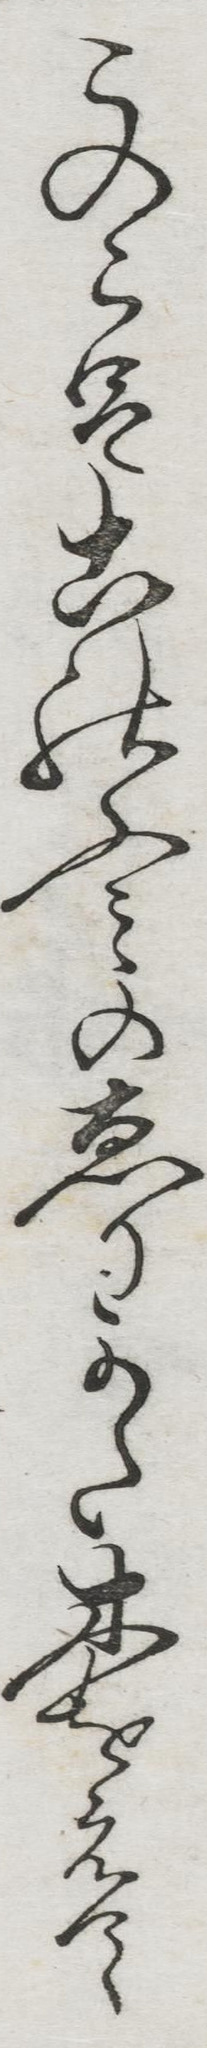このころこのふみのゑりかたきをえて
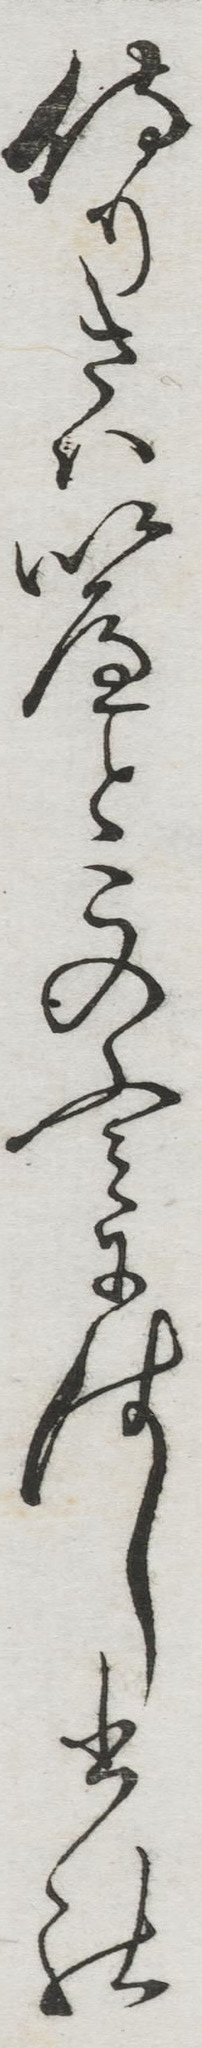侍りさはいへとこのふみにはし書の
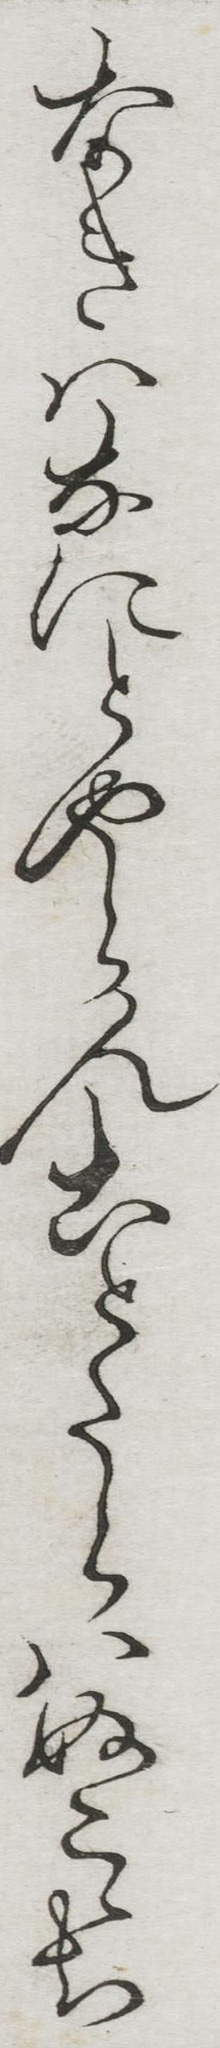なきはなにとやらんことたらはぬこゝち
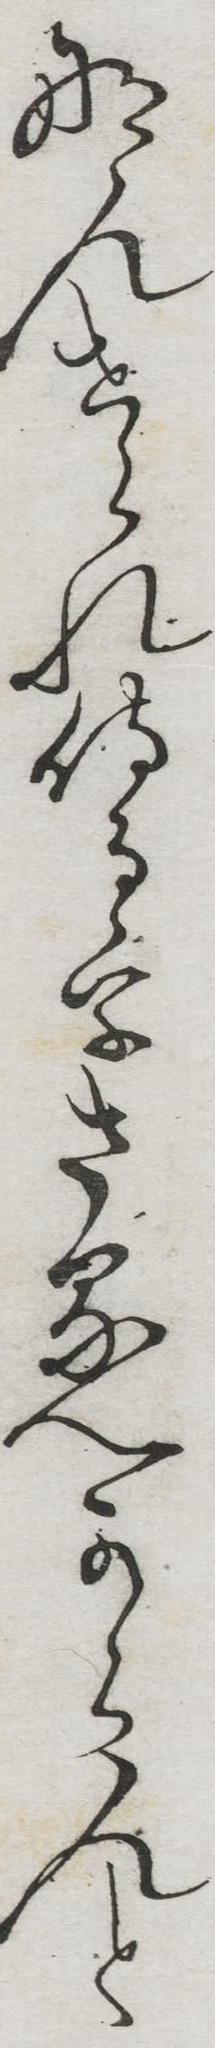なんせられ侍るをさるへからんと

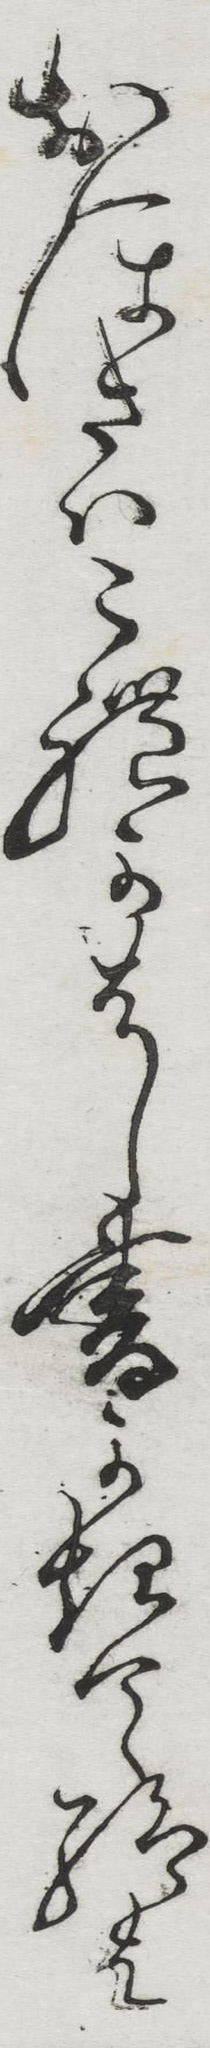おほさはこれかはし書かきて給は
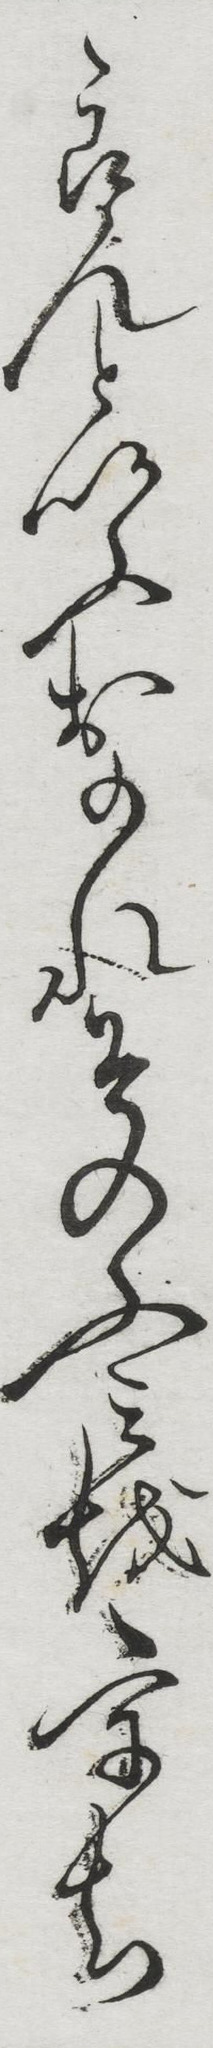らんといふおのれそのふみをうち
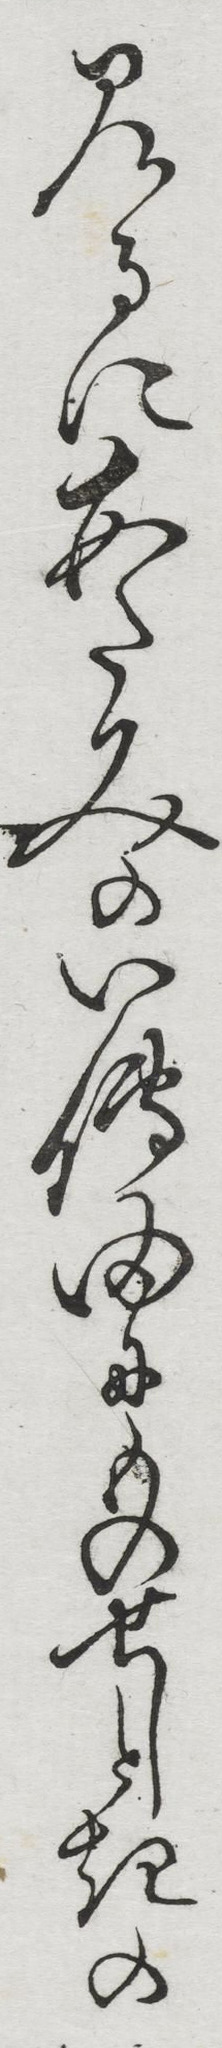みるにあたみのいてゆにものせしときの
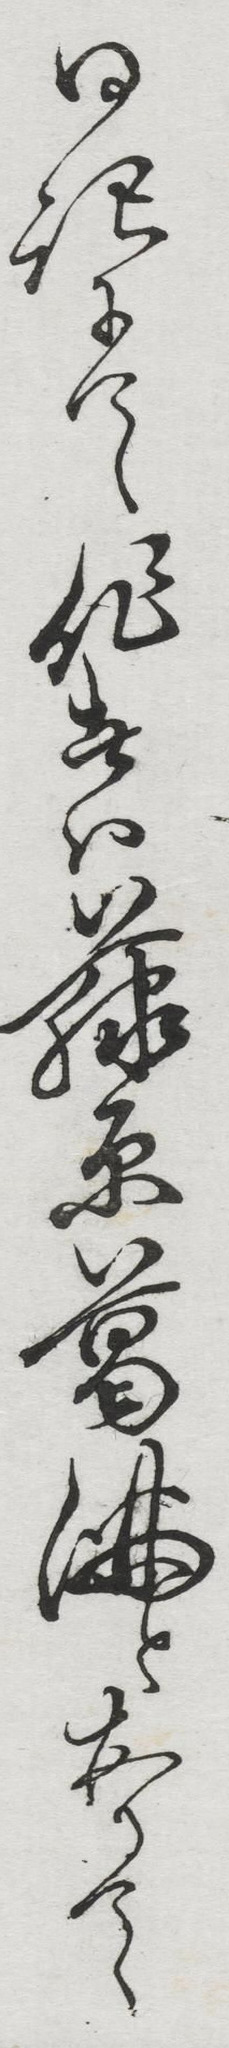日記にて作者は藤原葛満とありて
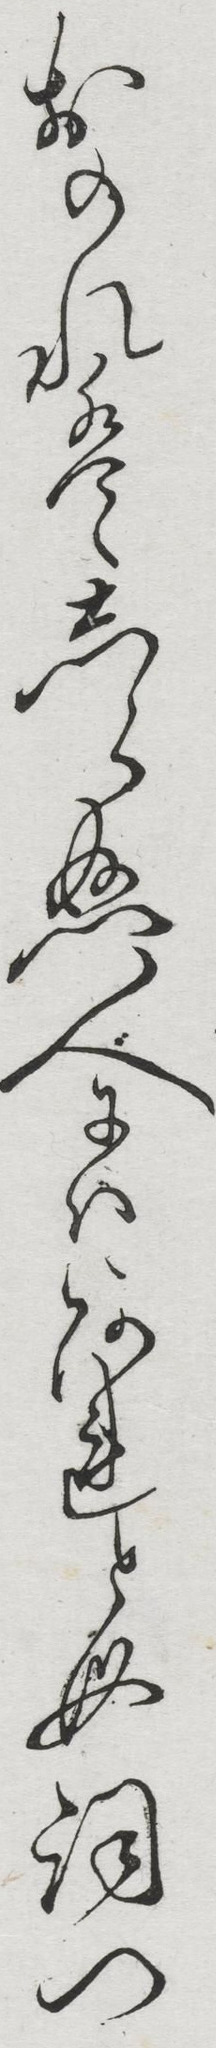おのれはしらぬ人にはあれとも詞つ
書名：挿画熱海日記　全
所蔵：東京大学地震研究所図書室 Earthquake Research Institute Library, The University of Tokyo, JAPAN
